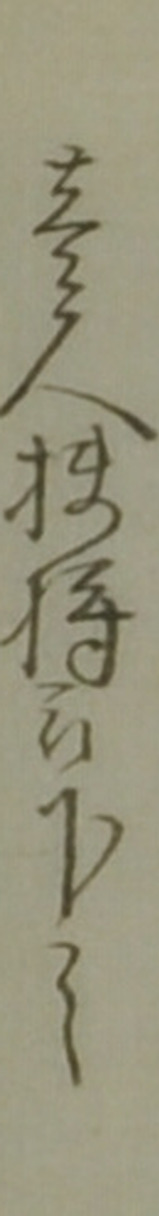壱人扶持被下之
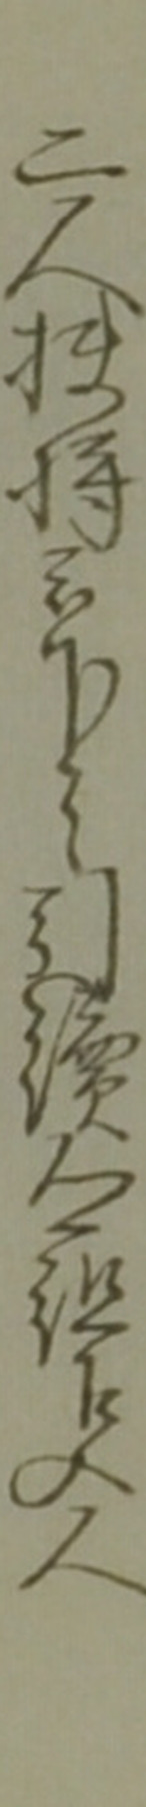二人扶持被下之引続郷組江入人
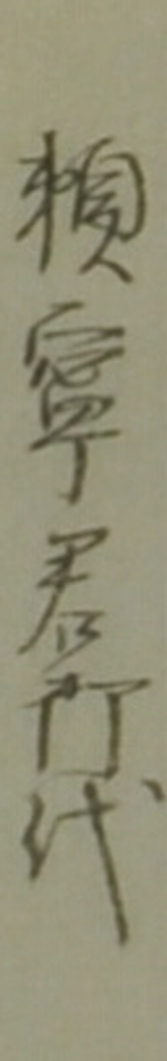頼寧君御代
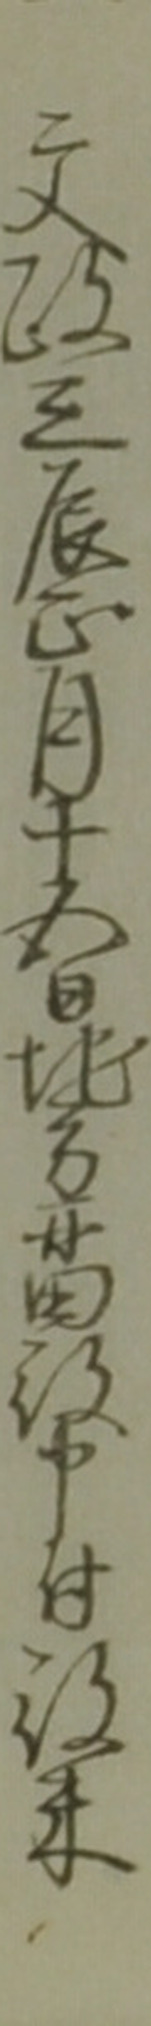一文政三辰正月十五日地方留役申付役来
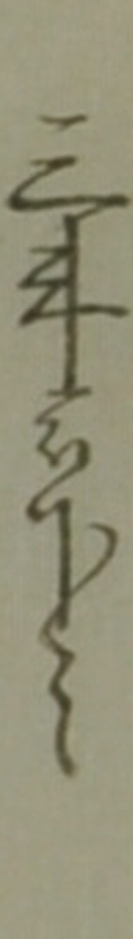三年被下之
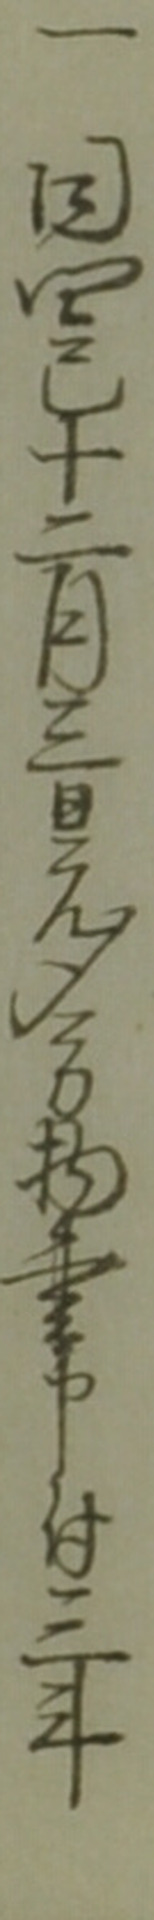一同四巳十二月三日元〆方物書申付三年
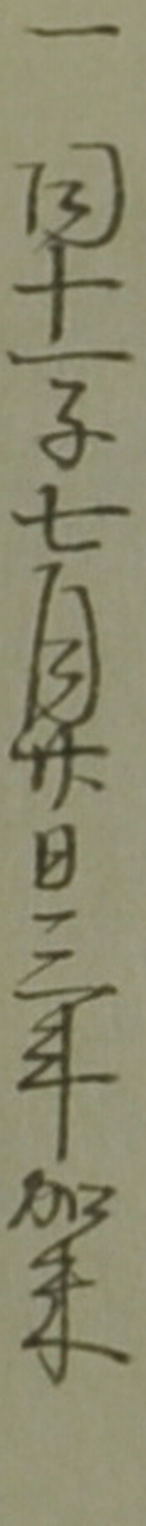一同十一子七月廿日三斗加米
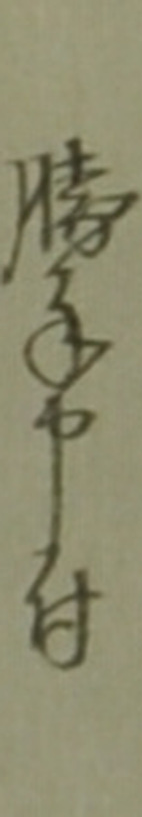勝手申付
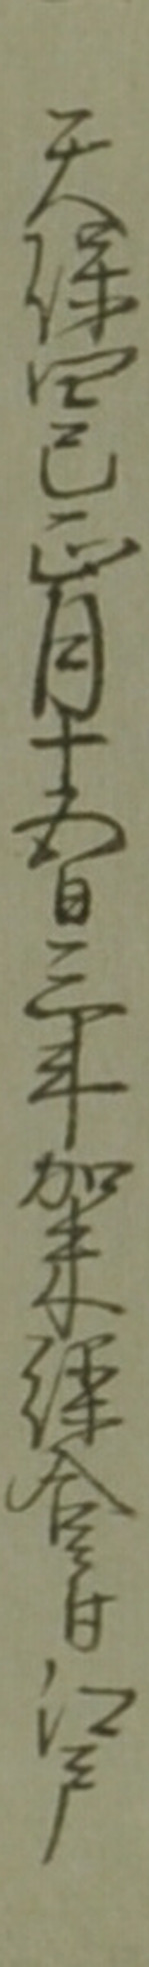一天保四巳正月十五日三斗加米繰合ニ付江戸
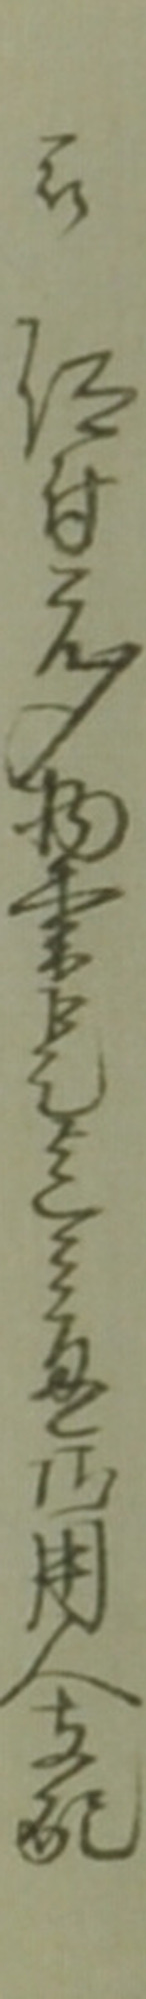被仰付元〆物書是迄之通御用人支配
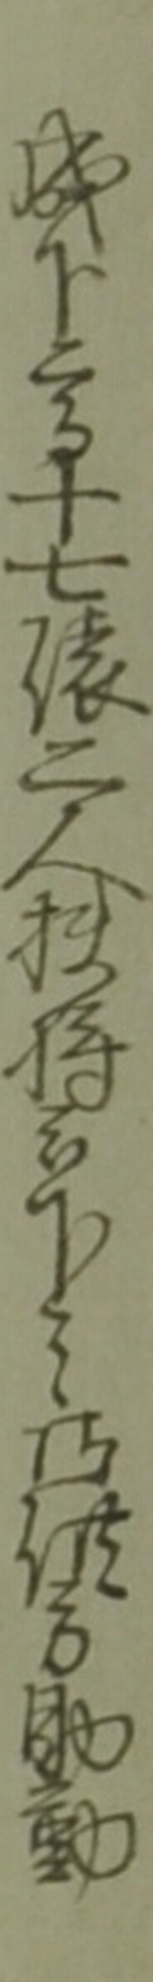成下高十七俵二人扶持被下之御供方助勤
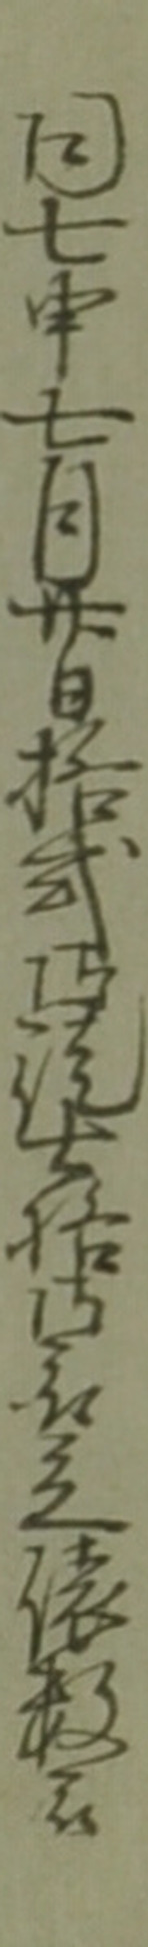一同七申七月廿日格式御徒士格御取立俵数被
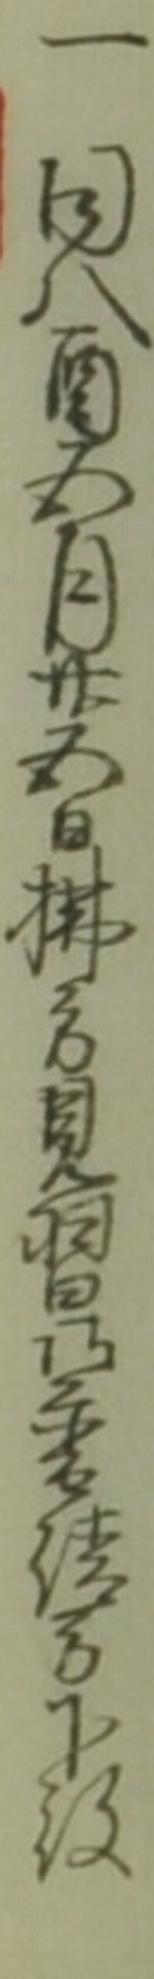一同八酉五月廿五日払方見習御普請方下役

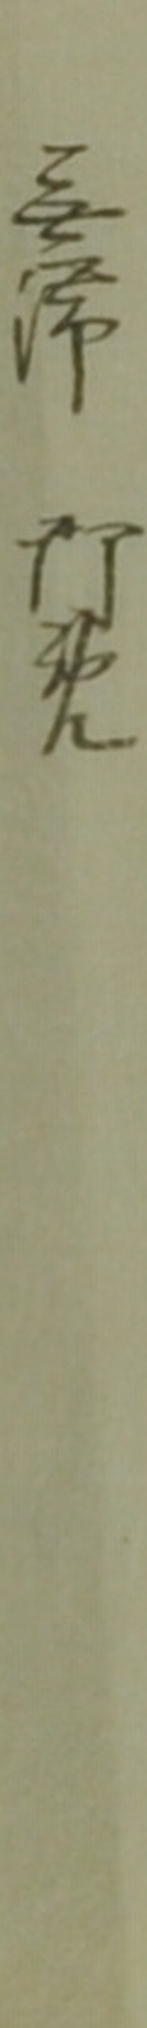無滞御免
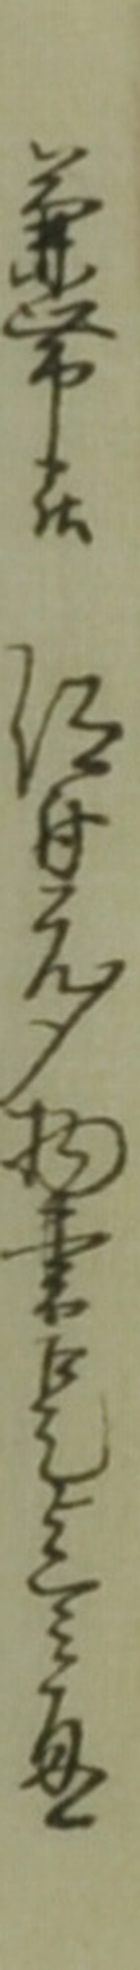兼帯被仰付元〆物書是迄之通
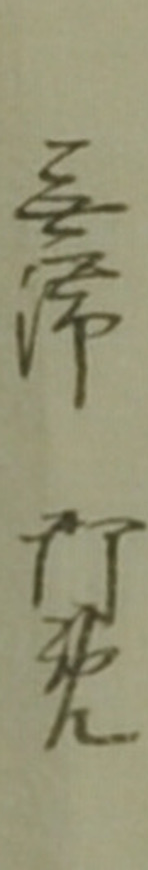無滞御免
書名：無足諸士勤仕録（八）
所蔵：伊那市立高遠町図書館・合同会社AMANE
